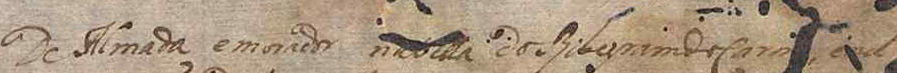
De Almada e morador na villa do Ribeyram do Carm_ e nel
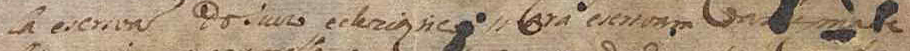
la escrivaõ do iuizo ecleziastico // ora escrivam da mesma _e
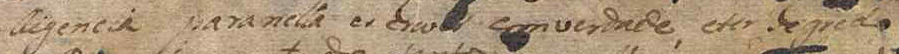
ligencia para nella escrever com verdade, e ter segredo
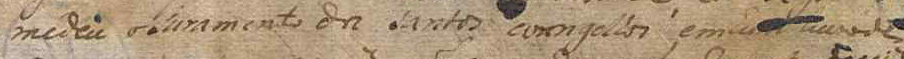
me deu o Iuramento dos santos evangelhos em hum liuro de
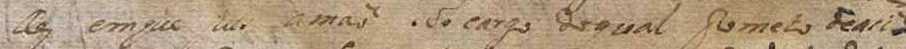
lles em que pus a maõ sob cargo do qual prometo de asī
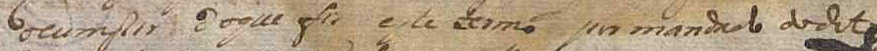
o cumprir do que fis este termo por mandado do dito
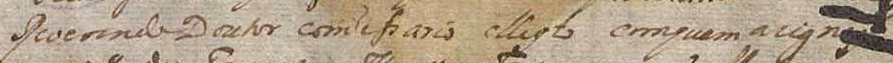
Reverendo Doutor comissario elleyto com quem asigney
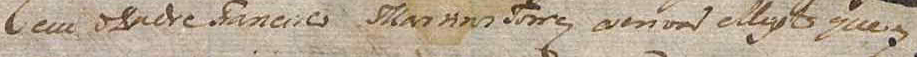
e eu o Padre Francisco Martins Torres escrivaõ elleyto que es
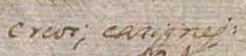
crevi; e asignej:
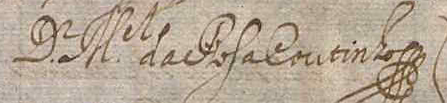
D.r M.el da Rosa Coutinho
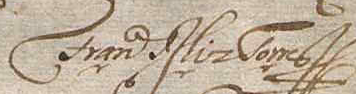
Fran.co Miz Torres
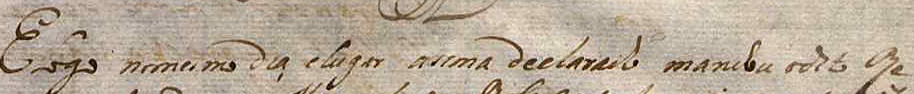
E Logo no mesmo dia, e lugar asima declarado mandou o dito Re
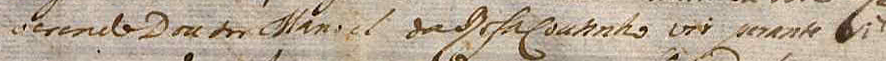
verendo Doutor Manoel da Rosa Coutinho vir perante si
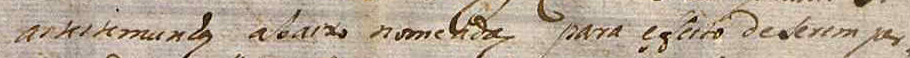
as testemunhas abaixo nomeadas para efeito de serem per
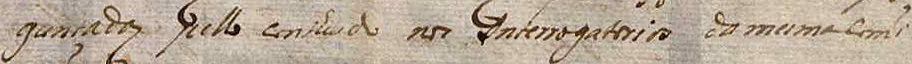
guntadas pello contudo nos Interrogatorios da mesma comi
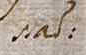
ssaõ:
